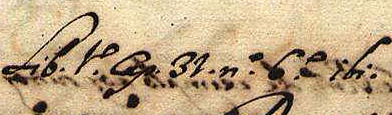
Lib.t.o Cap. 31. n.o 6.o ibi.
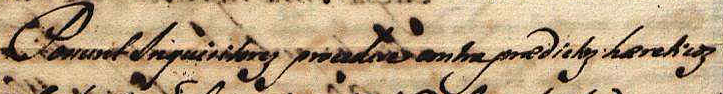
Possunt Inquisitorez procedere contra predictos hereticoz
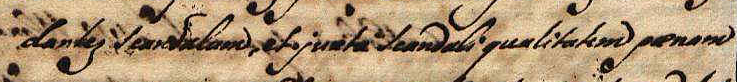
dantez scandulam, et junta scandali qualitatem pænam
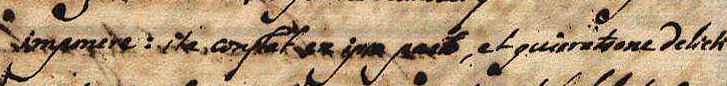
imponere: ita constatan ipso pacto, et quia ratione delicti
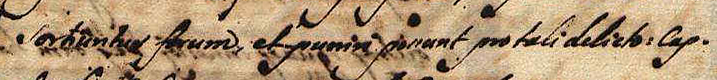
sortiuntur forum, et punire possunt pro tali delicto: Cap.
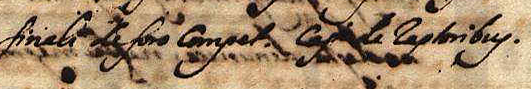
finali de foro compet. cap de Reptoribus.
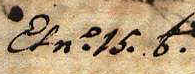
Et n.o 15. t̄.o
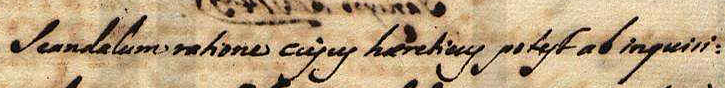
Scandalum ratione cujus hereticus potest ab inquisi
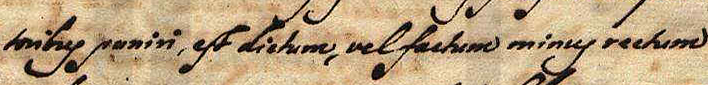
toribus puniri, est dictum, vel factum minus rectum
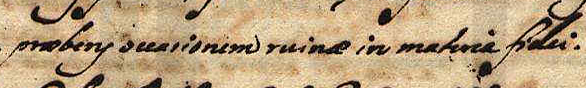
probens occasionem ruinæ in materia fidei.
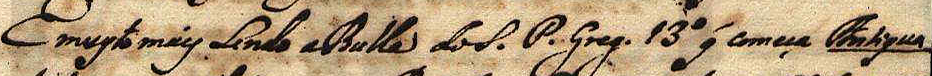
E muyto mais Lendo a Bulla do S. P. Greg. 13o q̄ começa Antiqua
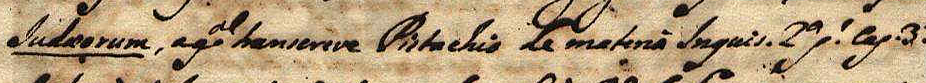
Iudæorum, a q.al transcreve Pistachio de materia Inquis. 2a p.a Cap. 3.o
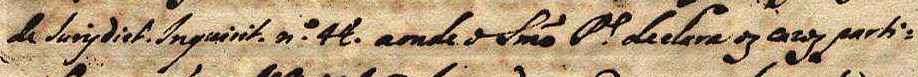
de Iurisdict. Inquisit. n.o 44. aonde o Sm̄o P.e declara oz cazos parti
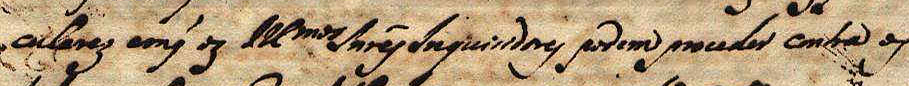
culares em q̄ oz Illmos Snrēs Inquisidores podem proceder contra os
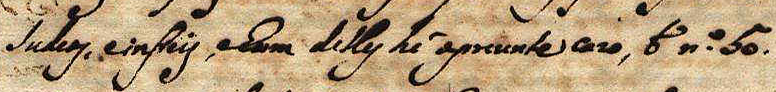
Iudeos, e infieis, e hum delles hé o prezente cazo, t̄ n.o 50.
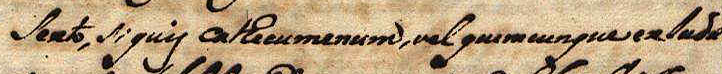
Sexto, si quis cathecumenum, vel quemcunque ex Iudæ
